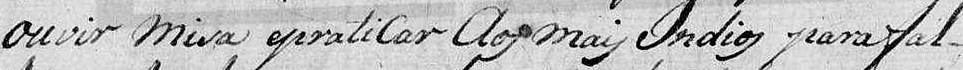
ouvir misa e pratiCar Aos mais Indios para fal
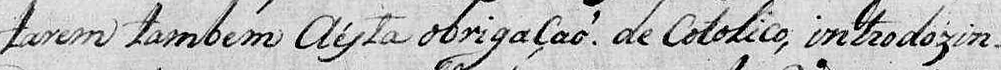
tarem tambem A ésta obrigaÇaõ. de Cotolico, introdozin
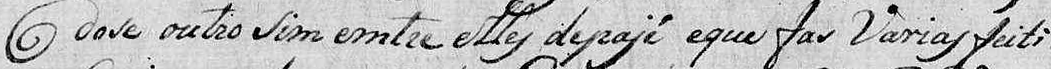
dose outrosim emtre elles de pajé e que fas Varias feiti
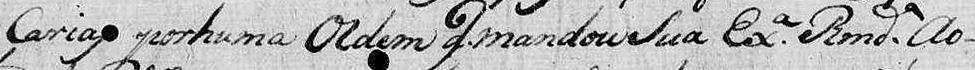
Çarias por huma Ordem q̄. mandou sua Ex.a Rmd.a Ao
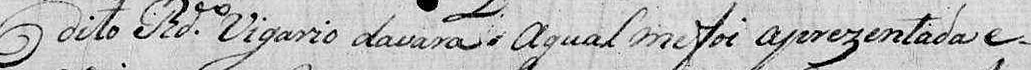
dito Rd.o Vigario da vara a qual me foi aprezentada e
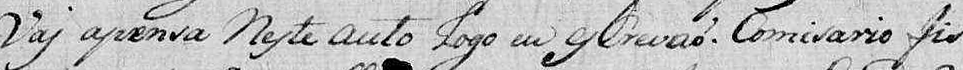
Vaj a prensa Neste auto Logo eu esCrevaõ. Comisario fis
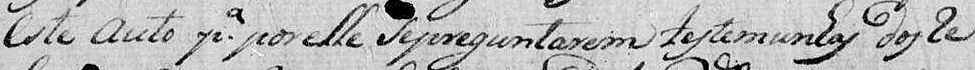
Este auto p.a por elle se preguntarem testemunhas dos Re
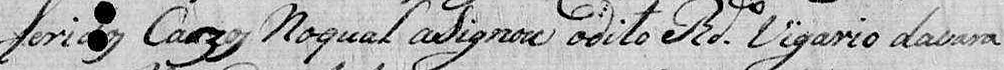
feridos Cazos No qual aSignou o dito Rd.o Vigario da vara
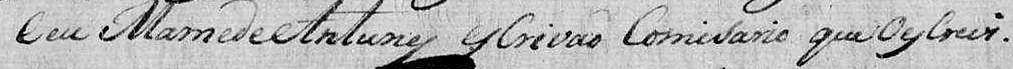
E eu Mamede Antunes esCrivaõ Comisario que o esCrevi
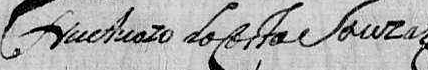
Fructuozo da Costa Souza
